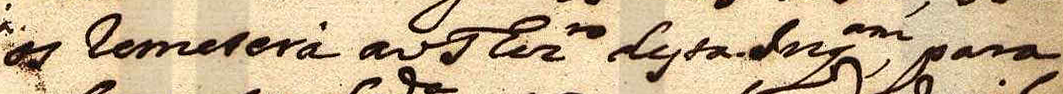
os Remeterá ao Thezro desta Inqam, para
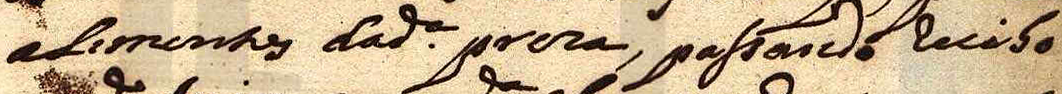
alimentos da d.a preza, passando recibo
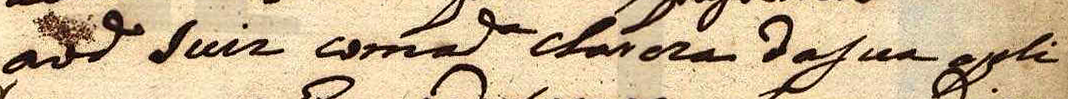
ao do Iuis com a da clareza da sua apli
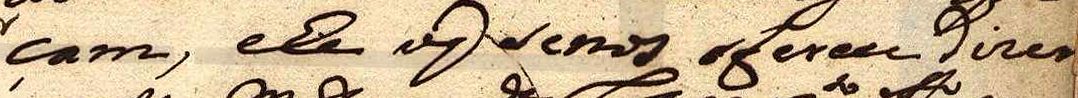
çam, e he o q̄ se nos oferece dizer
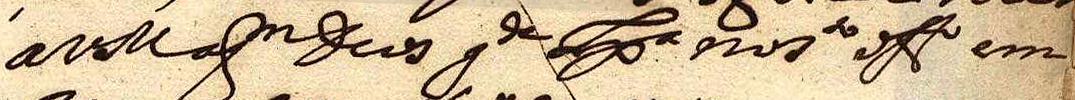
a v M a q̄m Deos g.de Lx.a no sto offo em
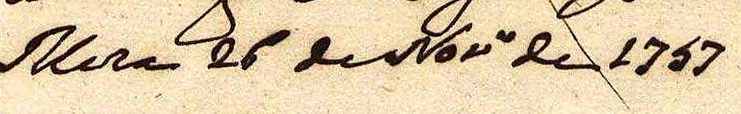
Meza 26 de Novo de 1757
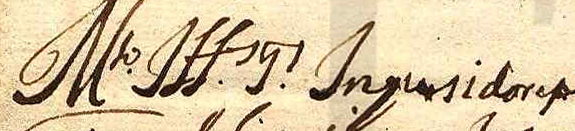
M.to Ill.s s.rs Inquisidores
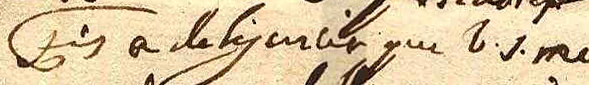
Fis a deligencia que v. s. me
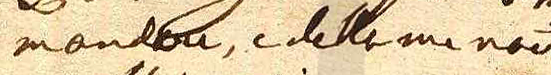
mandou, e della me naõ
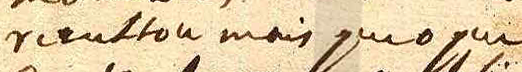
rezultou mais que o que
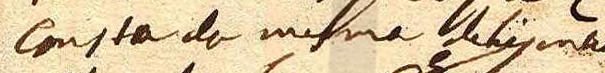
Consta da mesma deligencia.
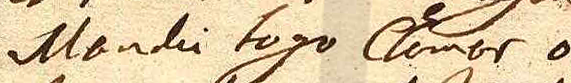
Mandei logo Chamar o
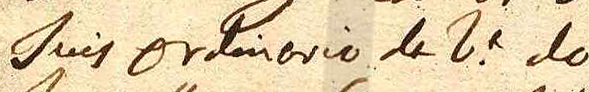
Iuis Ordinario da V.a do
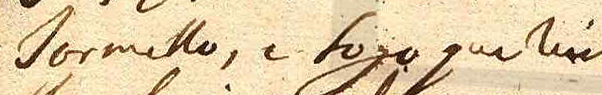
Iarmello, e logo que vier
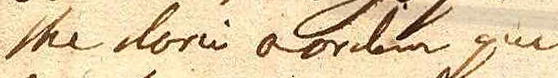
lhe darei a ordem que
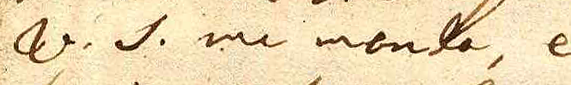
V. s. me manda, e
